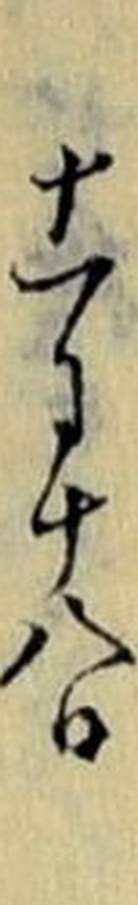十一月十八日
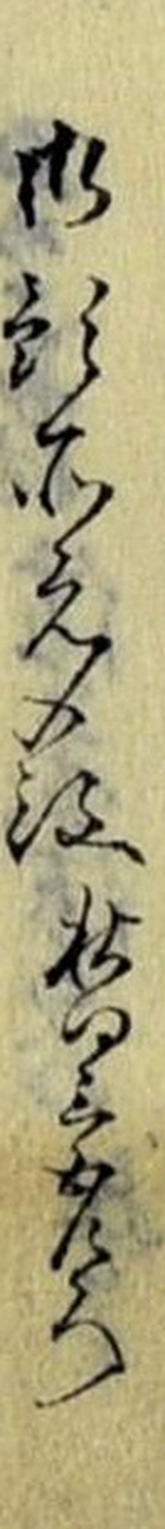御預所元〆役横田三五左衛門
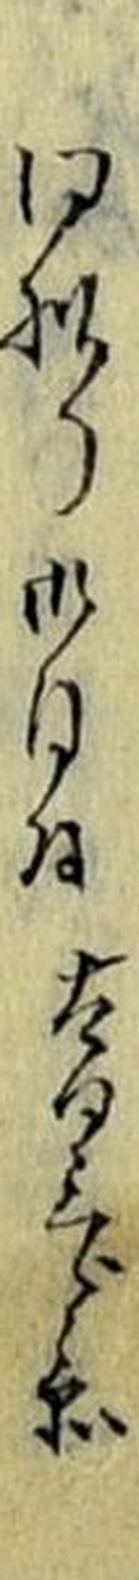同掛り御目付太田三郎兵衛
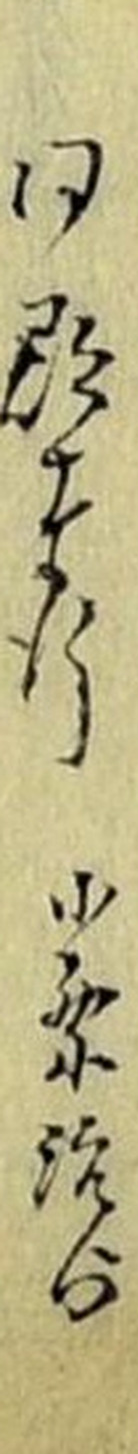同郡奉行小栗治右衛門
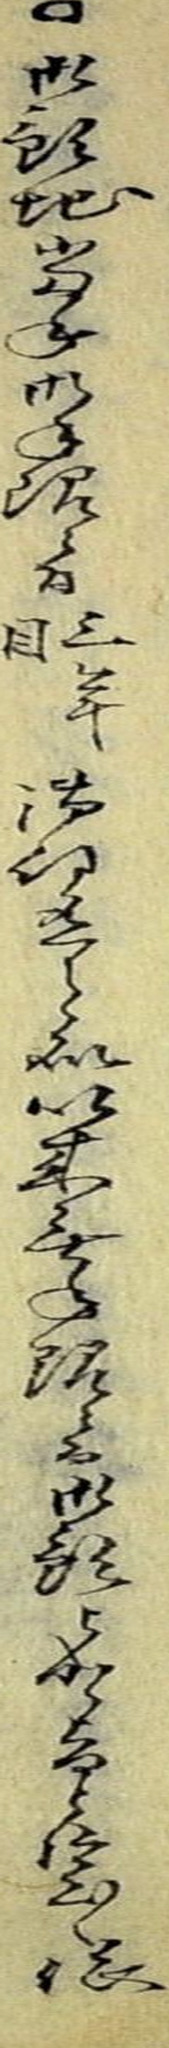○御預地当年御年限に付三年目御伺有之候処以來無年限に而御預被成候旨被仰出候依
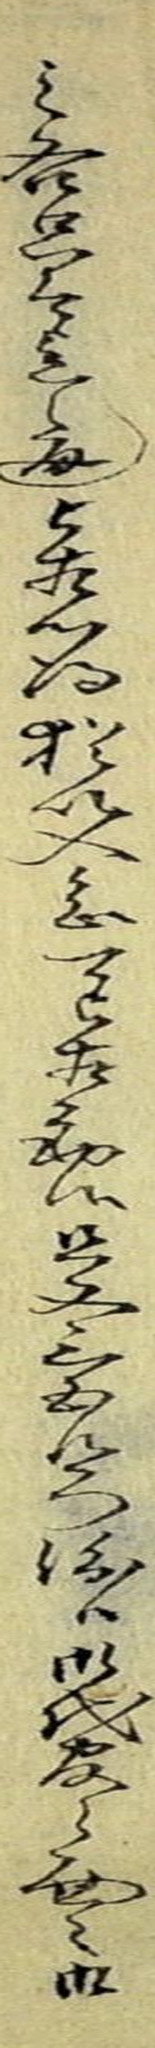之各只今迄之通被相心得猶以入念可被相勤候且又三五左衛門儀は御代官之面々御
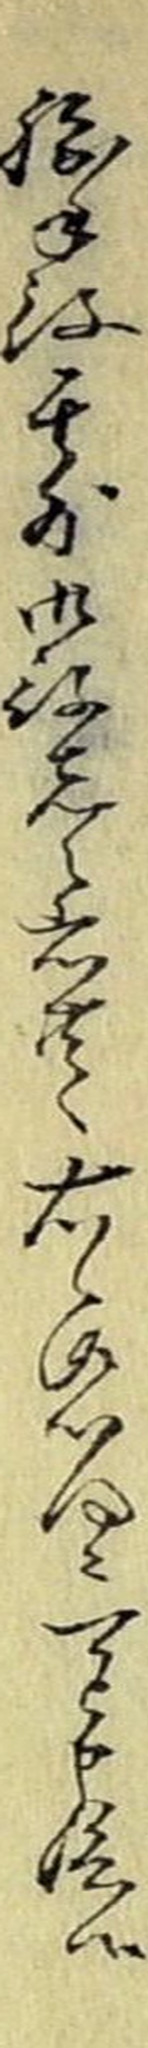勝手役其外御役先之者共へ右之趣心得に可被申渡候
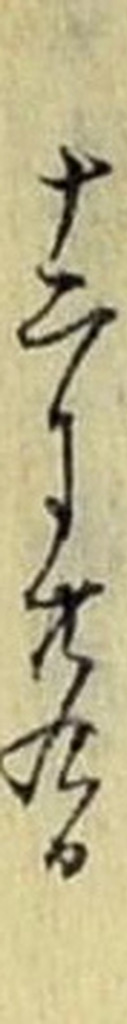十二月廿九日
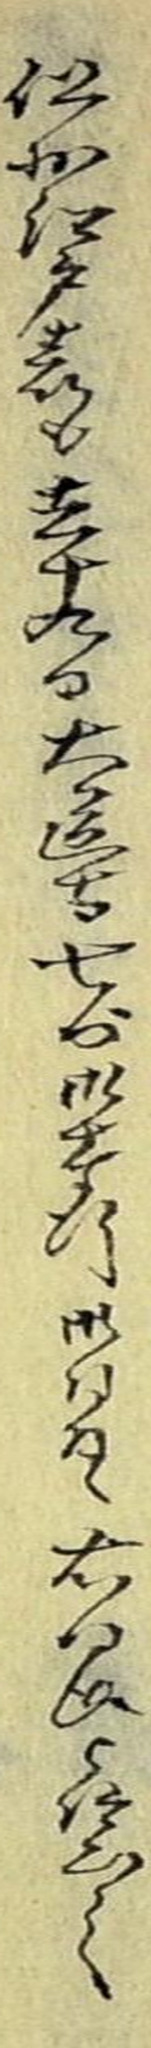但於江戸表も去十九日大道寺七右衛門御奉行御目付へ右同趣仰出之
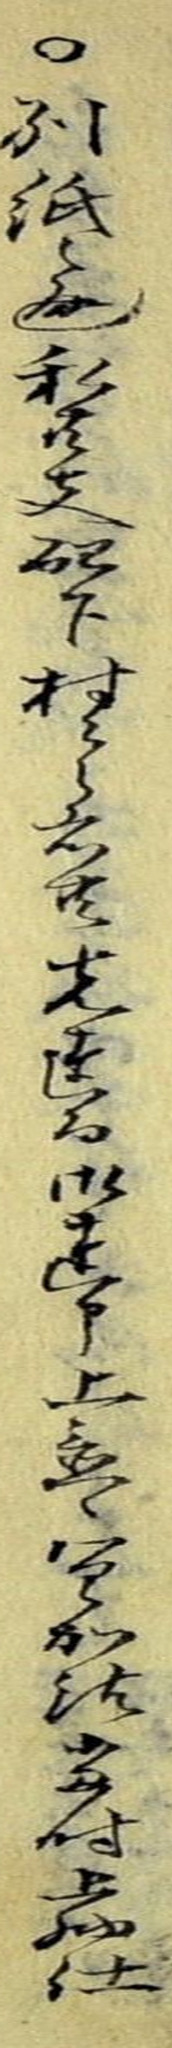○別紙之通私共支配下村々之者共先達而御達申上置候冥加銀当時上納仕

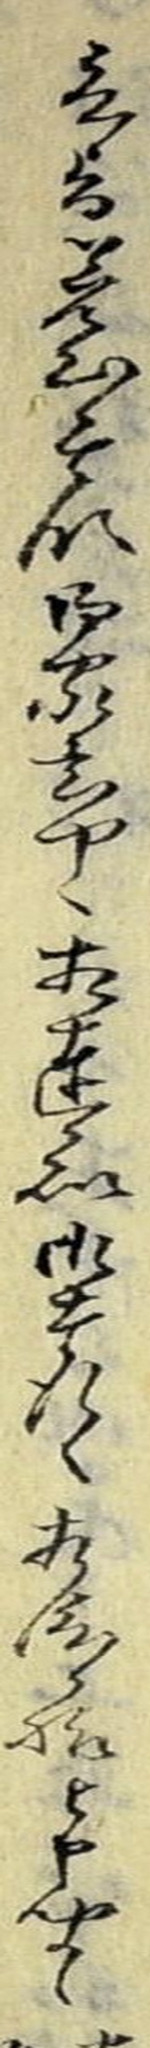度旨差出其段御家老中へ相達候処御奉行へ相渡候様被申聞候
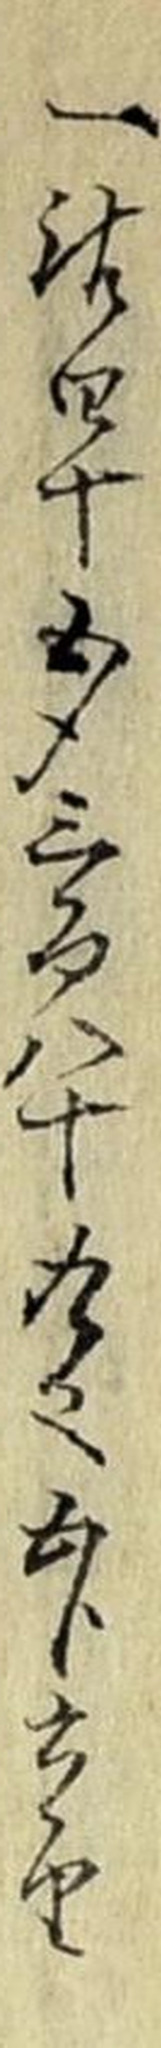一銀四十五貫三百八十九匁五分六厘上領
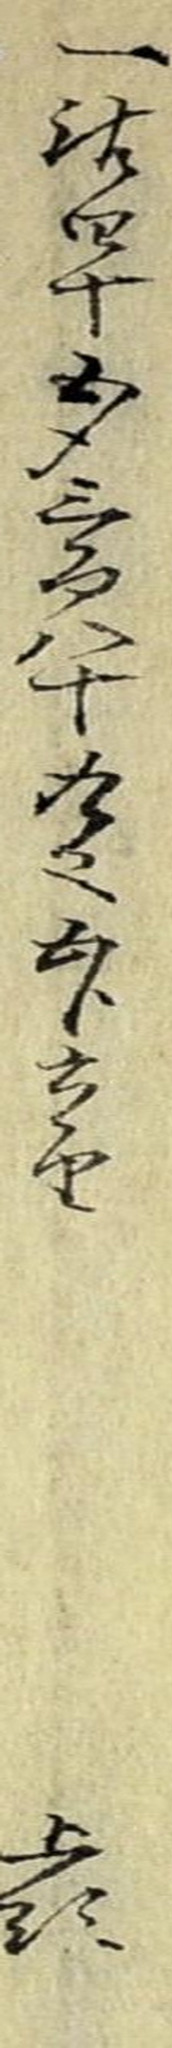一銀四十五貫三百八十九匁五分六厘上領
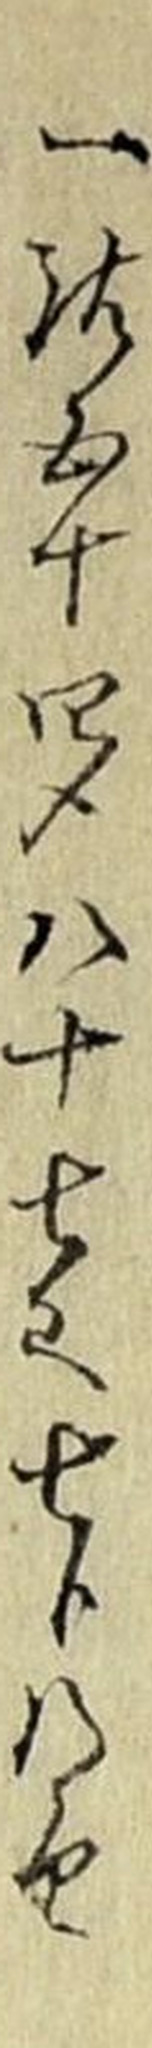一銀五十四貫八十七匁七分八厘中領
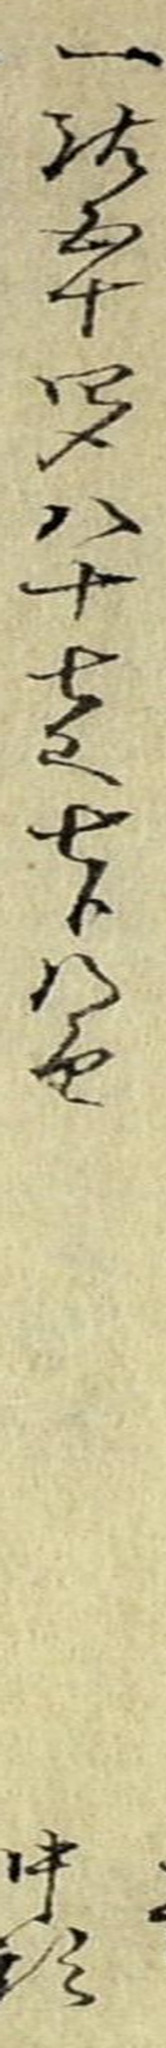一銀五十四貫八十七匁七分八厘中領
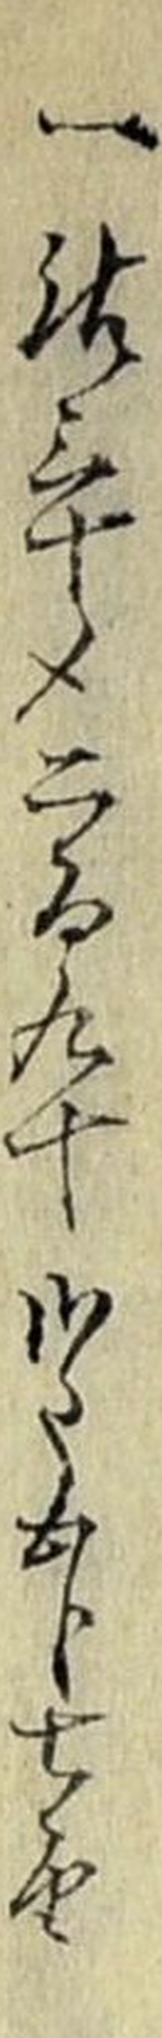一銀三十貫二百九十弐匁五分七厘下領
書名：命令之部 六
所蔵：福井県文書館 Fukui Prefectural Archives
